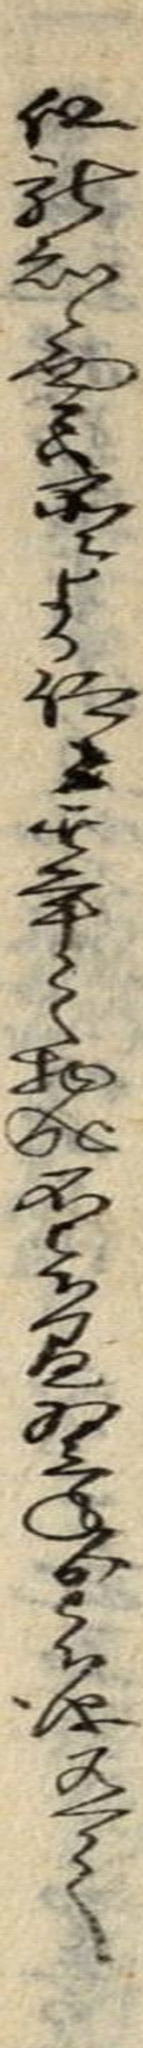但新知之面々は品により仰之其年之物成不被下置翌年ゟ被下儀有之
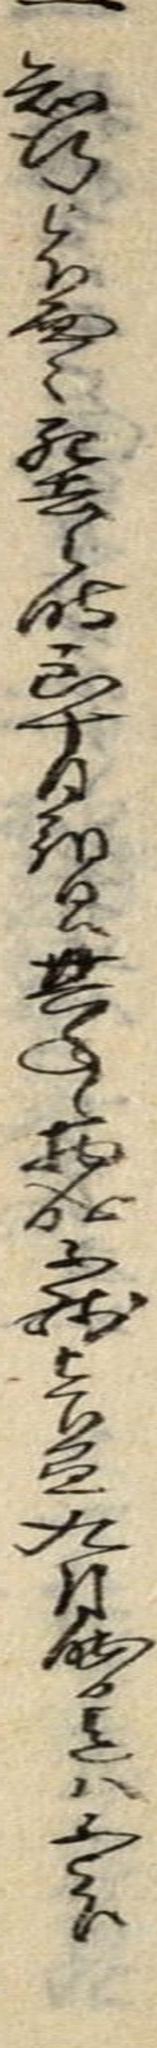一知行被下面々死去之時至十月朔日は其年之物成不残被下置九月晦日迄は不被下
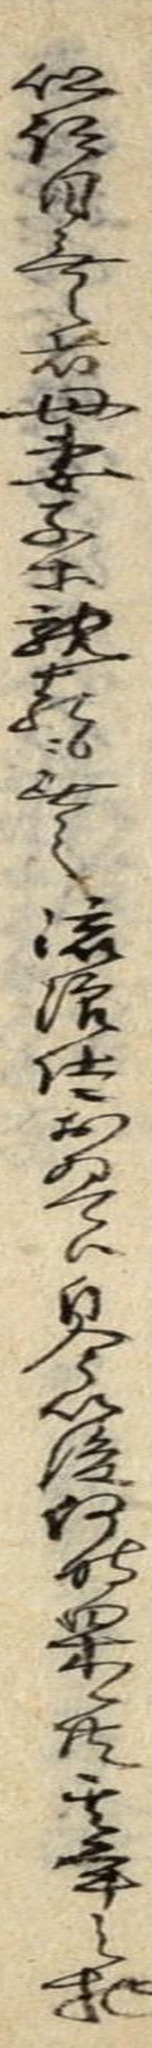但跡目無之者母妻子等親類も無之流浪仕におゐては自今以後何時果候共其年之物
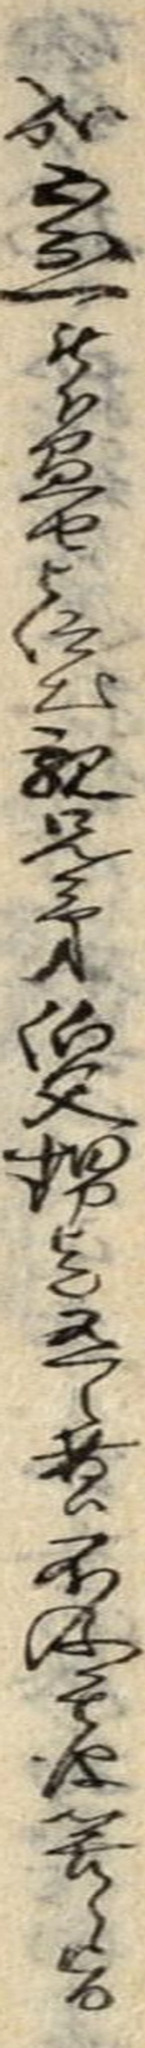成五分一被下置由被仰出親兄弟伯父甥迄有之者は不及其儀筈之旨
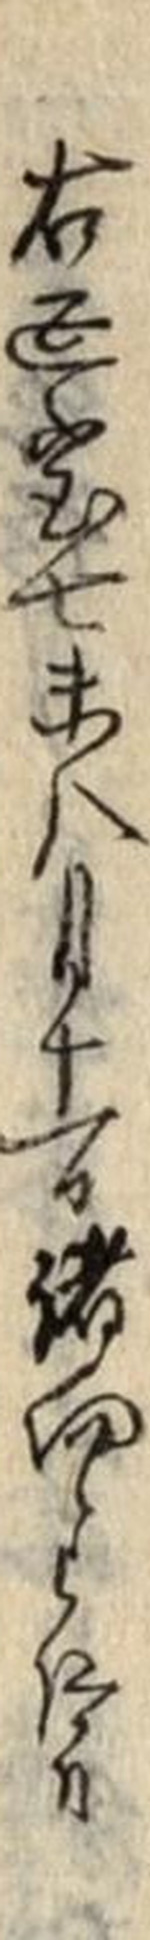右延宝七未八月十一日諸向へ被仰付
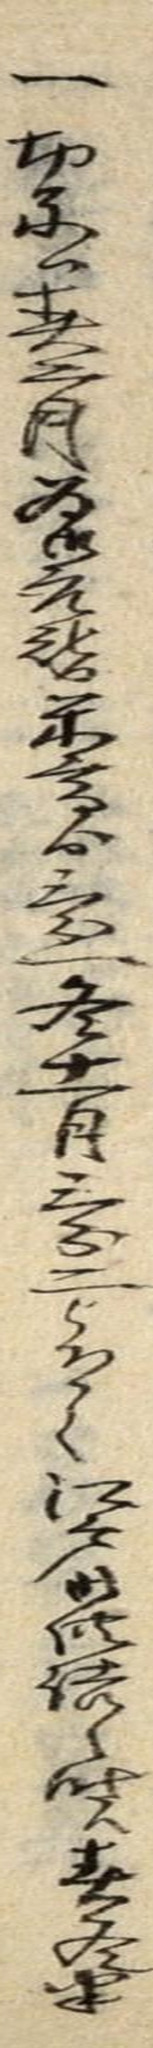一切米は春二月為御取替米高ゟ三分一冬十一月三分二被下之江戸御供詰之時は春冬半
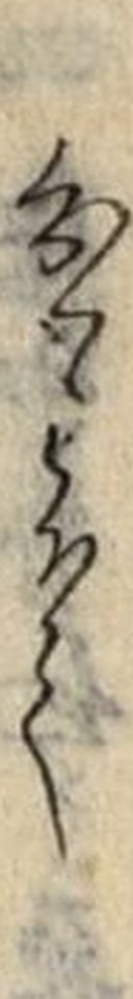分ツゝ被下之
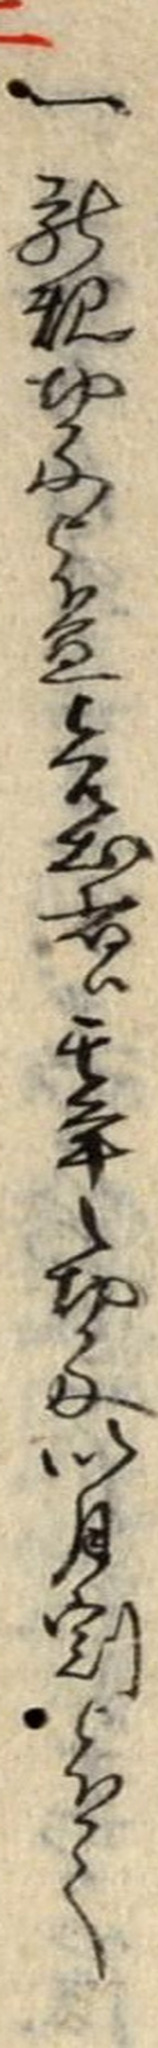一新規切米被下置被召出候者は其年之切米以月割被下之

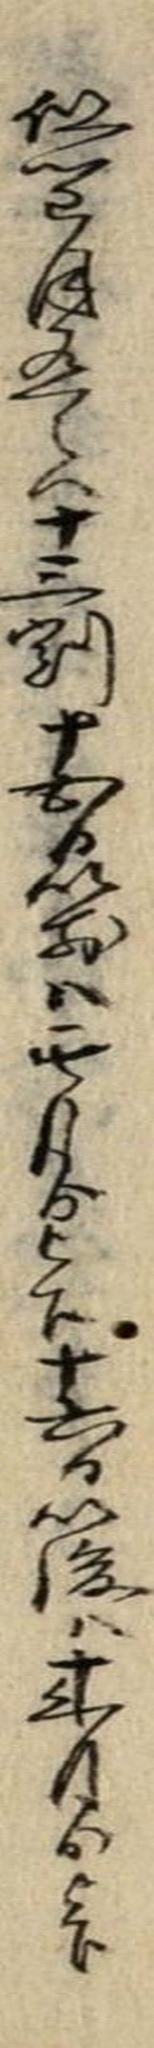但閏月有之は十三割十五日以前は其月ゟ被下十六日以後は来月ゟ被下
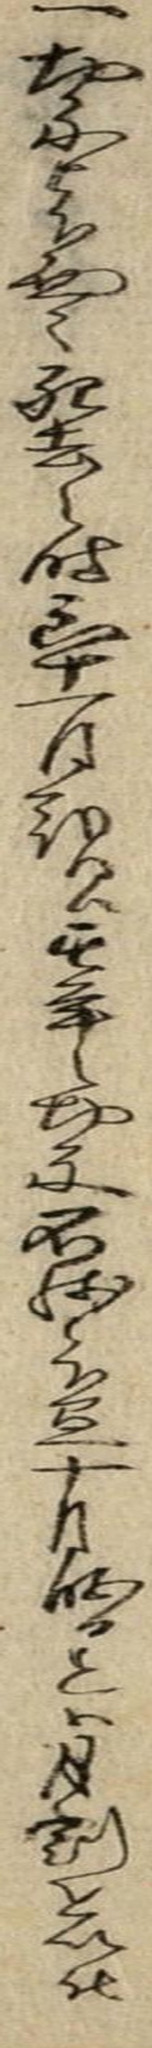一切米被下面々死去之時至十一月朔日は其年之切米不残被下置十月晦日迄は月割を以被
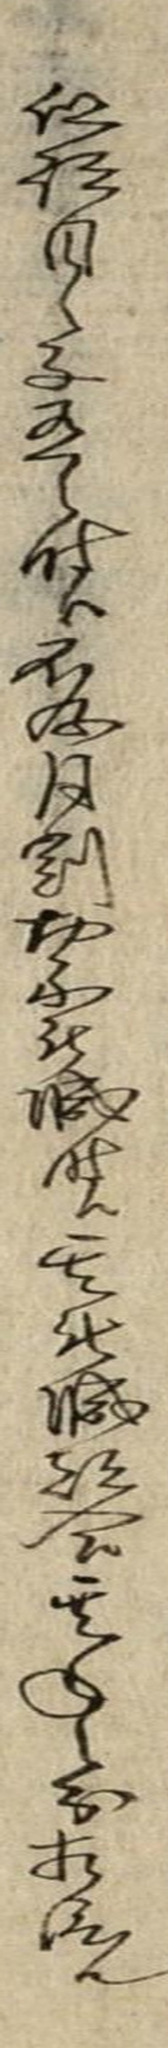但跡目之子有之時は不及月割切米被減時は其被減都合其年之分相渡ル
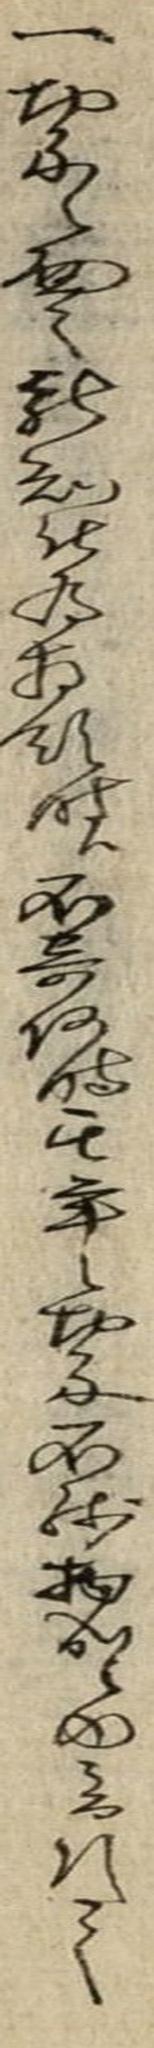一切米之面々新知被為拝領候時は不寄何時其年之切米不残物成之内に而引之
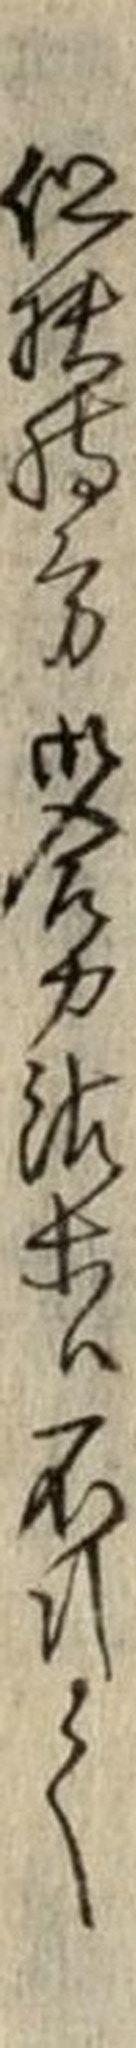但扶持方御合力銀等は不引之
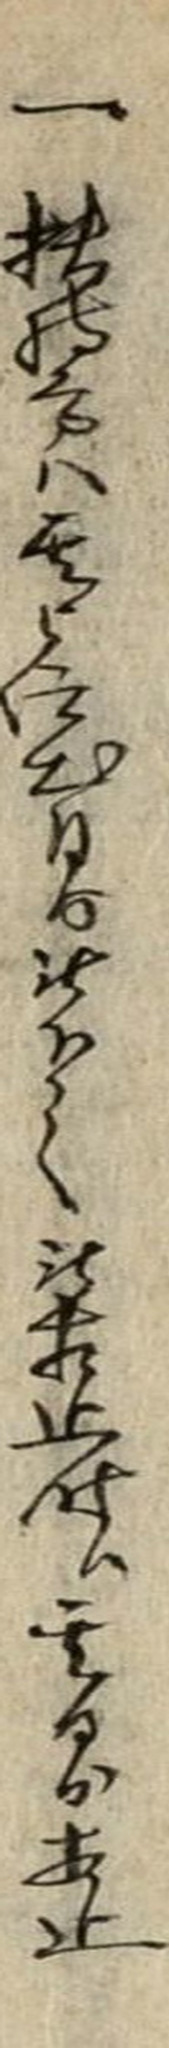一扶持方は其被仰出日ゟ被下之被相止候時は其日ゟ相止
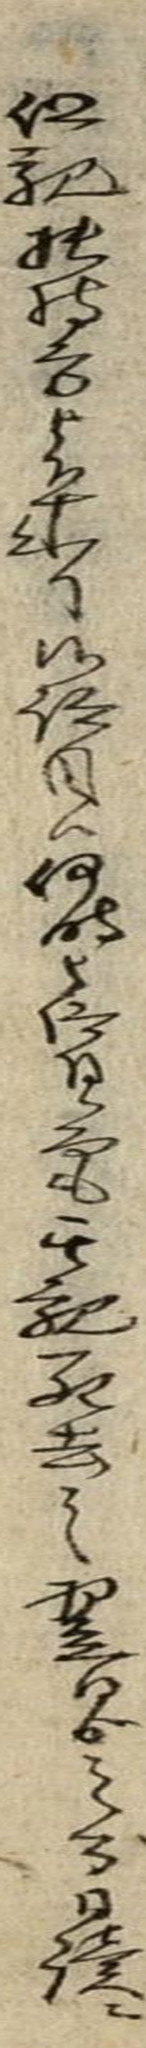但親扶持方被下来り候跡目は何時被仰付候而も其親死去之翌日ゟ之分日続に
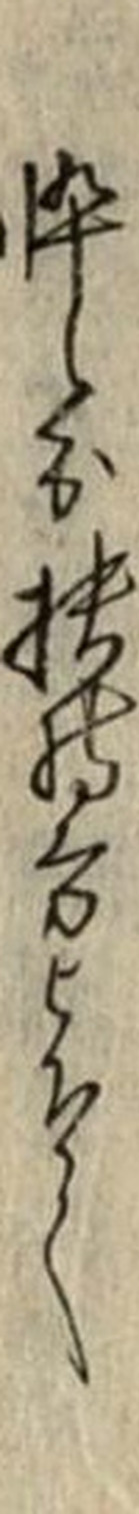忰之分扶持方被下之
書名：御用并被仰出之部
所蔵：福井県文書館 Fukui Prefectural Archives
